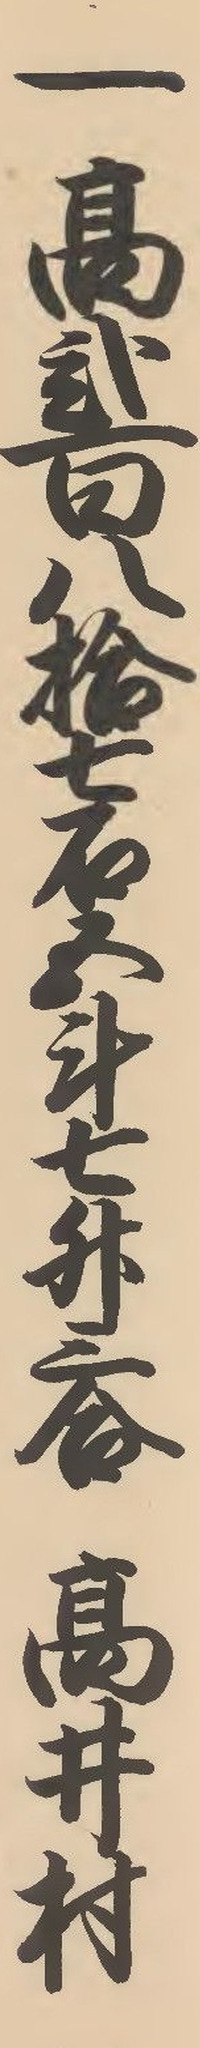一髙弐百八拾七石五斗七升三合髙井村
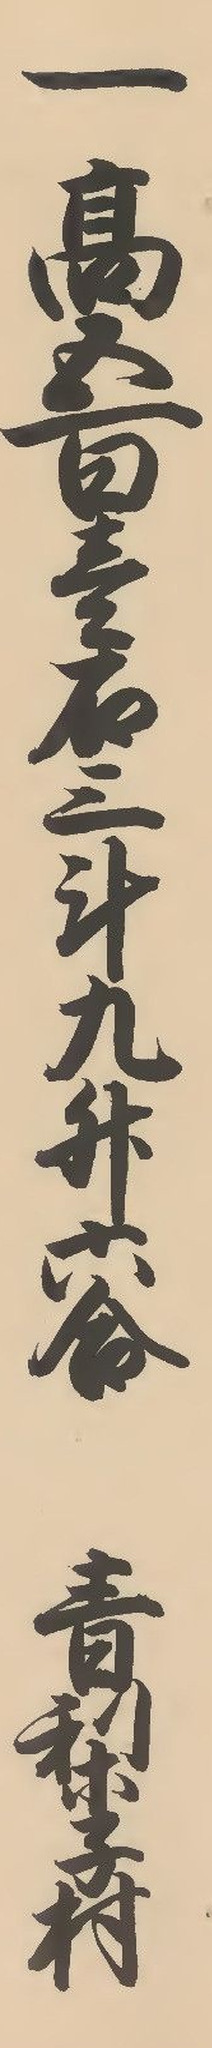一髙五百壱石三斗九升六合青梨子村
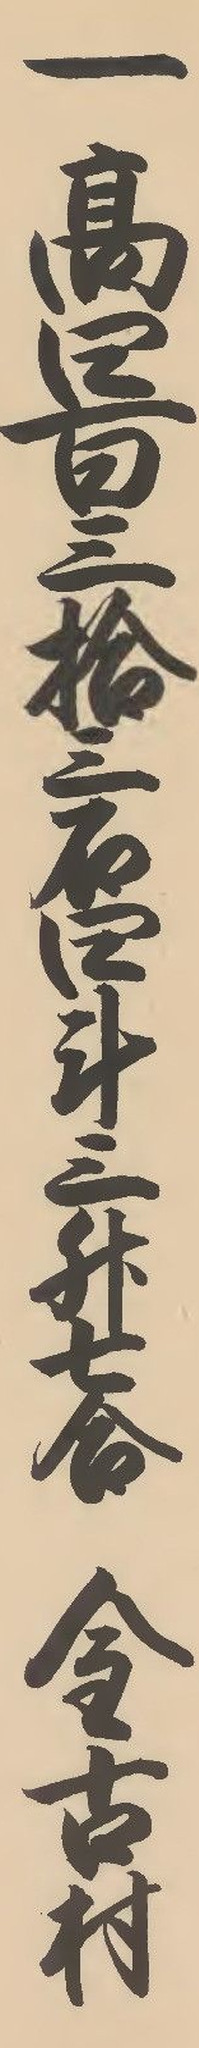一髙四百三拾三石四斗三升七合金古村
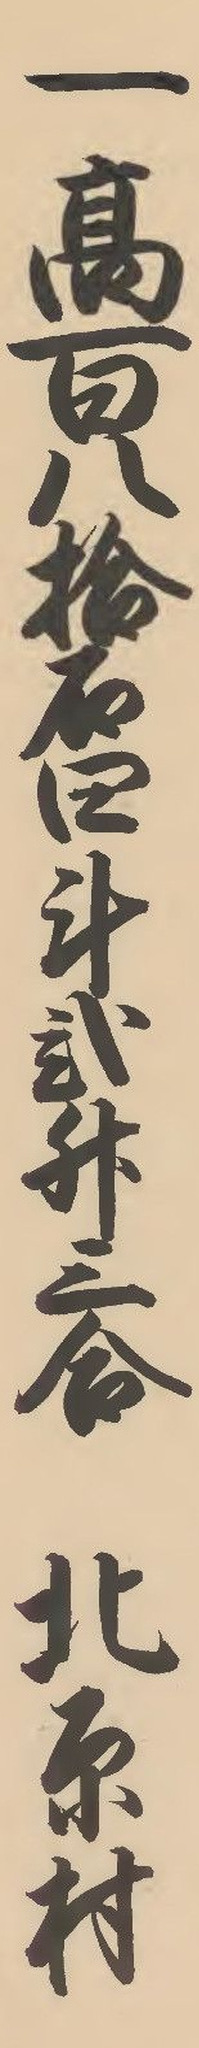一髙百八拾石四斗弐升三合北原村

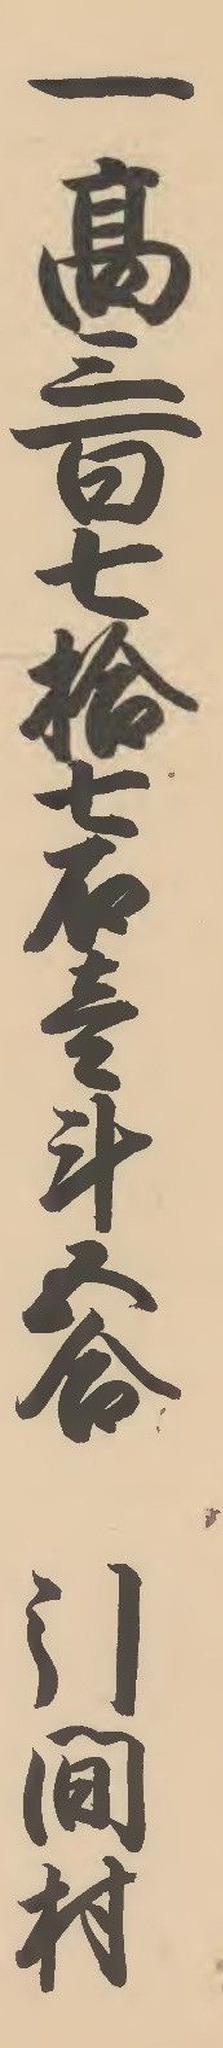一髙三百七拾七石壱斗五合引間村
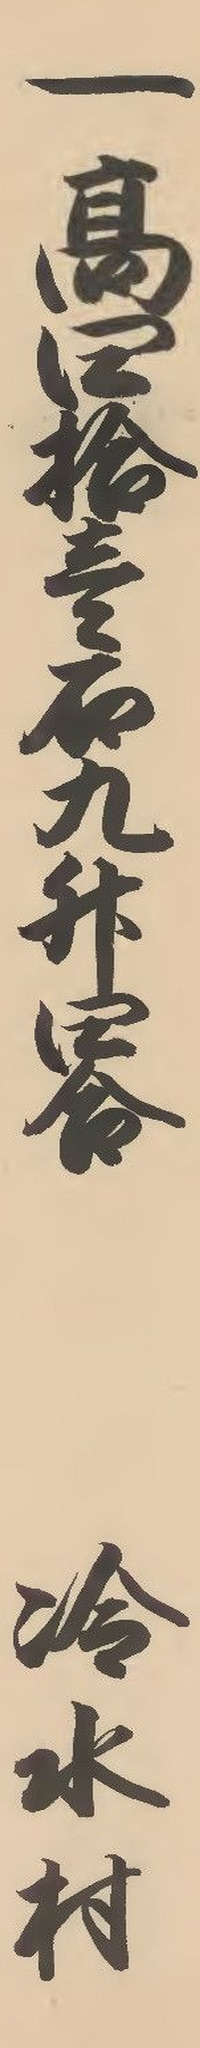一髙四拾壱石九斗四合冷水村
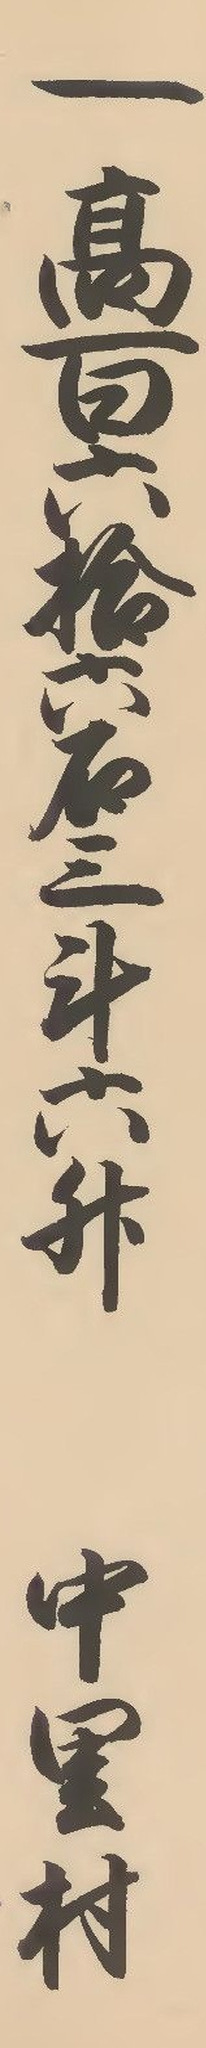一髙百六拾六石三斗六升中里村
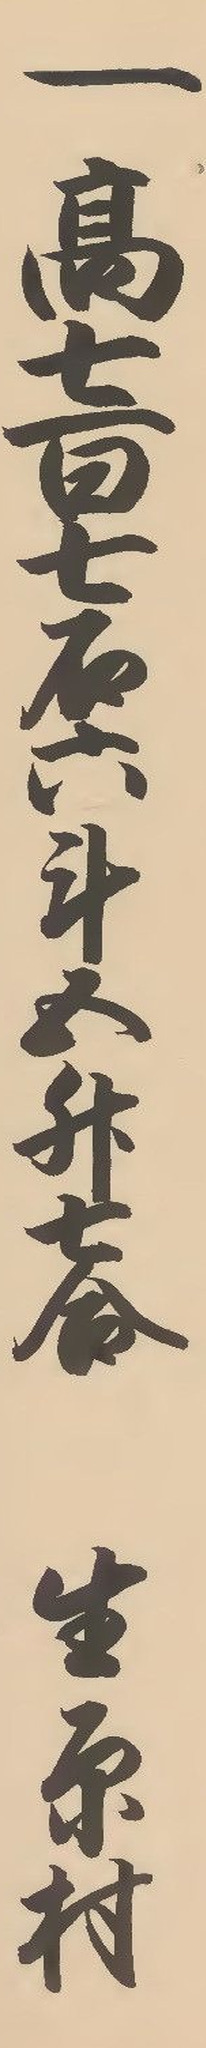一髙七百七石六斗五升七合生原村
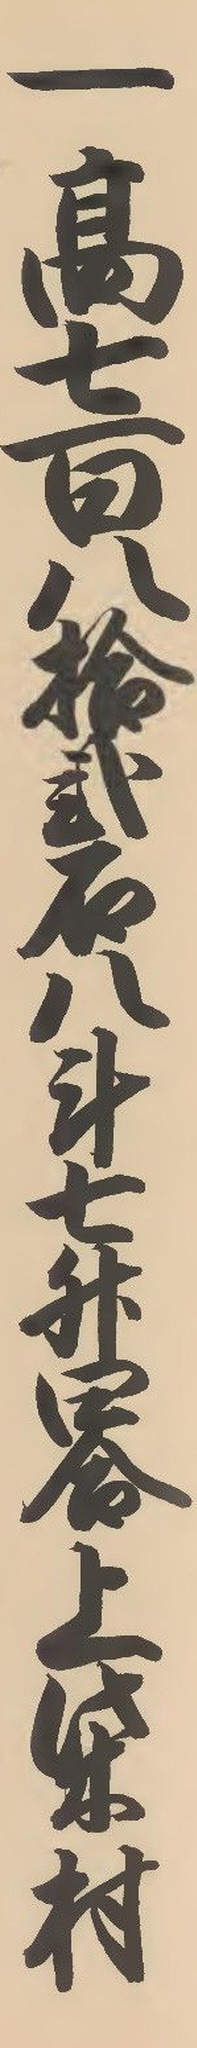一髙七百八拾弐石八斗七升四合上柴村
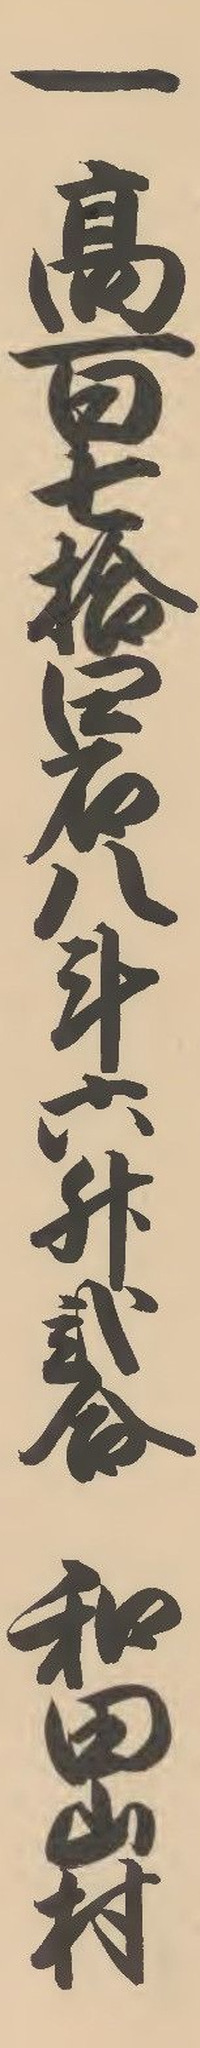一髙百七拾四石八斗六升弐合和田山村
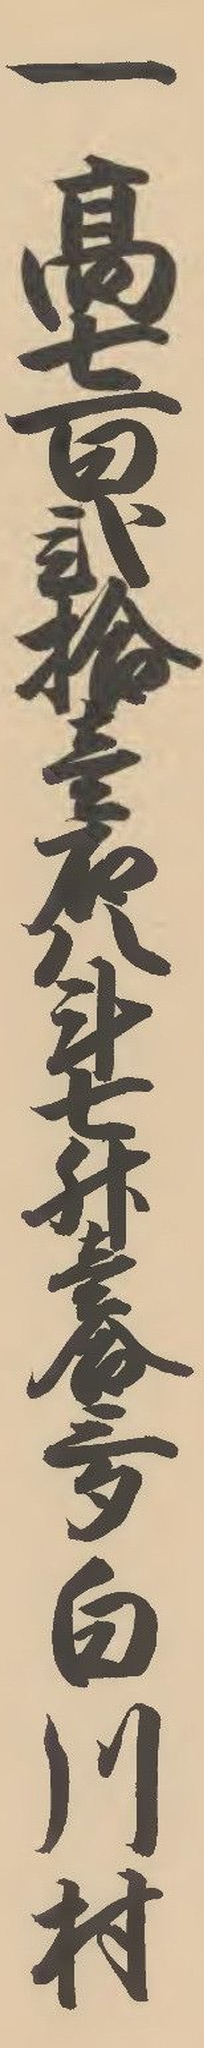一髙七百弐拾壱石八斗七升壱合三夕白川村
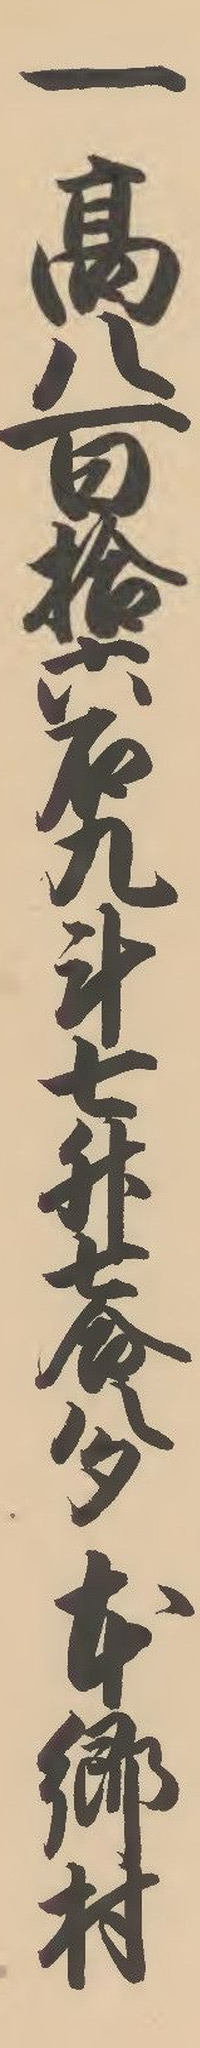一髙八百拾六石九斗七升七合八夕本郷村

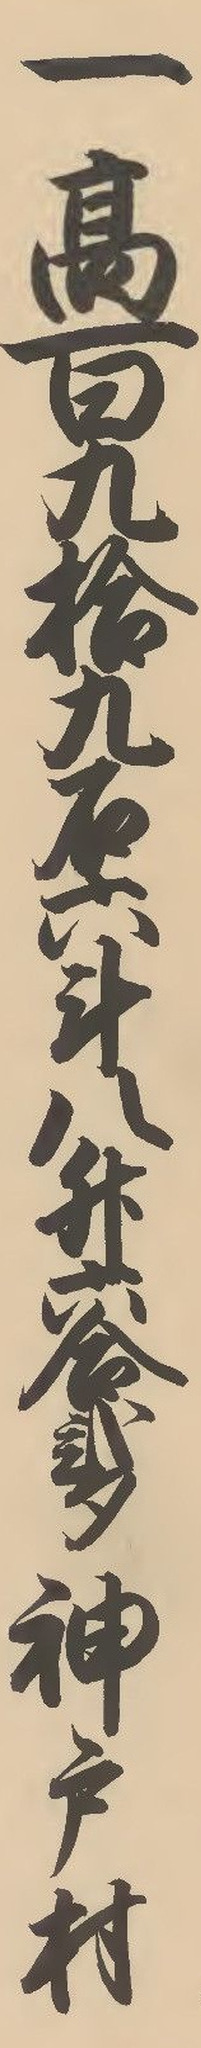一髙百九拾九石六斗八升六合弐夕神戸村
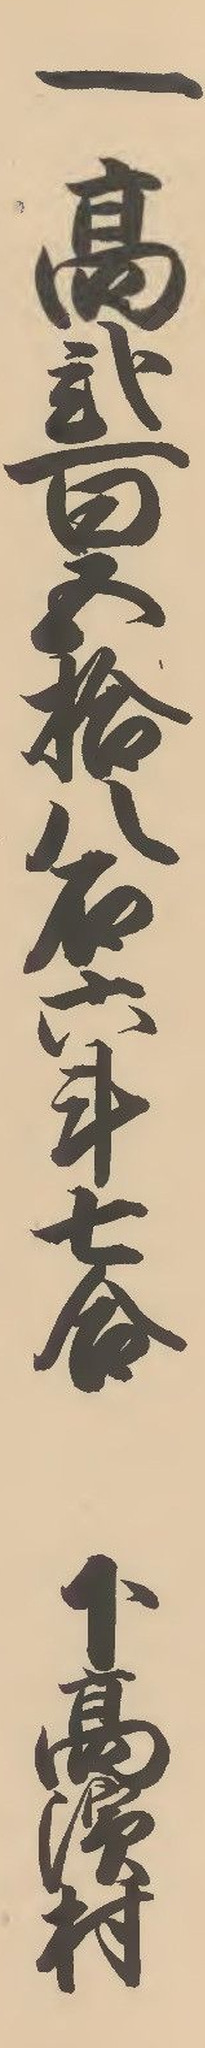一髙弐百五拾八石六斗七合下髙濱村
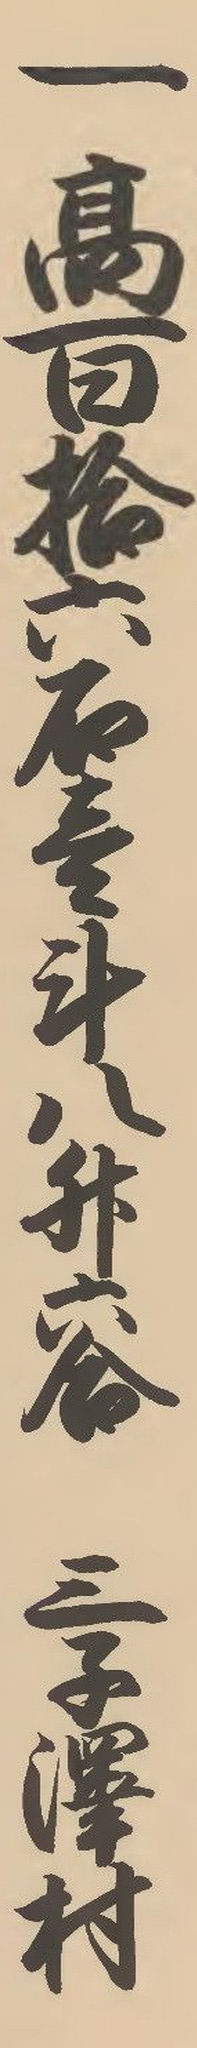一髙百拾六石壱斗八升六合三子澤村
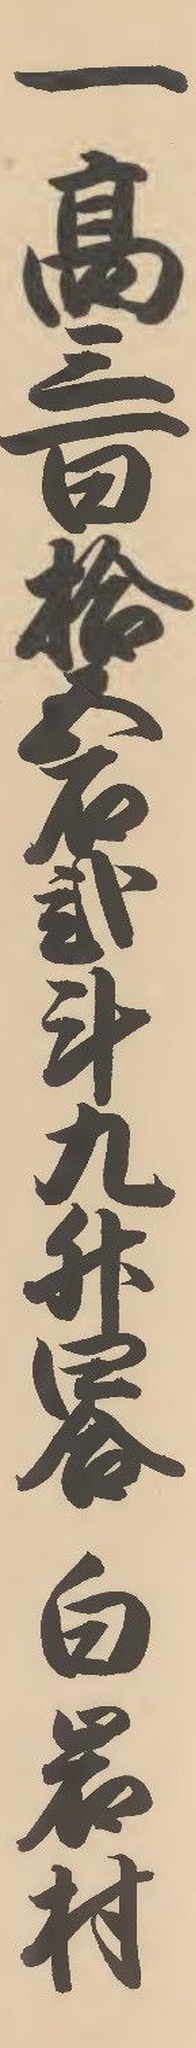一髙三百拾五石弐斗九升四合白岩村
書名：上野国郷帳
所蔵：国立公文書館 National Archives of Japan
